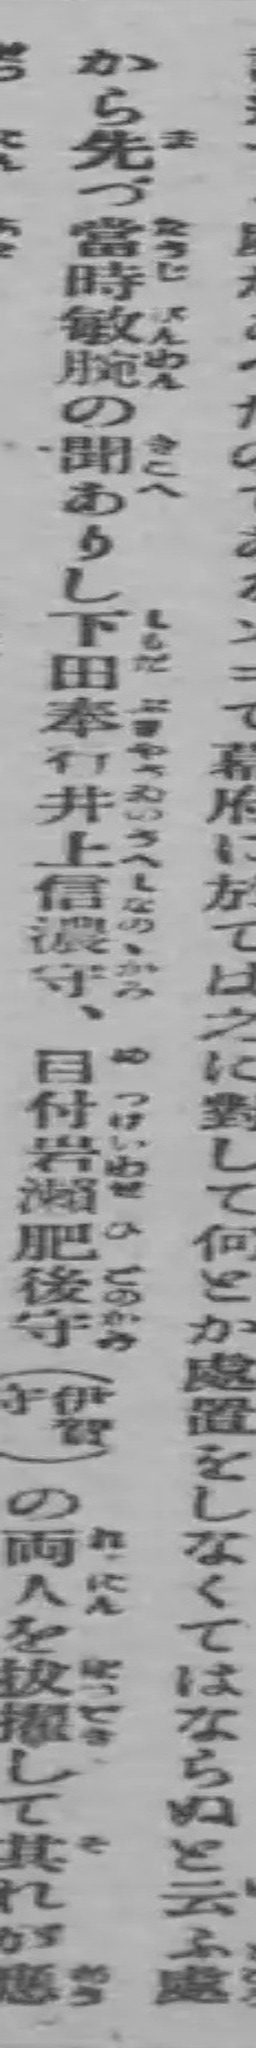から先づ当時敏腕の聞ありし下田奉行井上信濃守、目付岩瀬肥後守(伊賀守)の両人を抜擢して其れが応
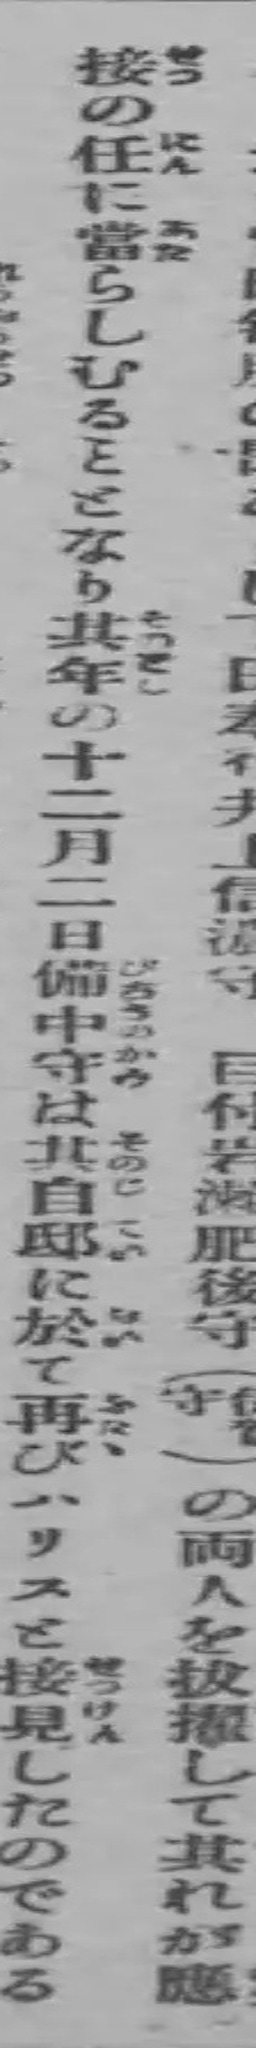接の任に当らしむることとなり其年の十二月二日備中守は其自邸に於て再びハリスと接見したのである
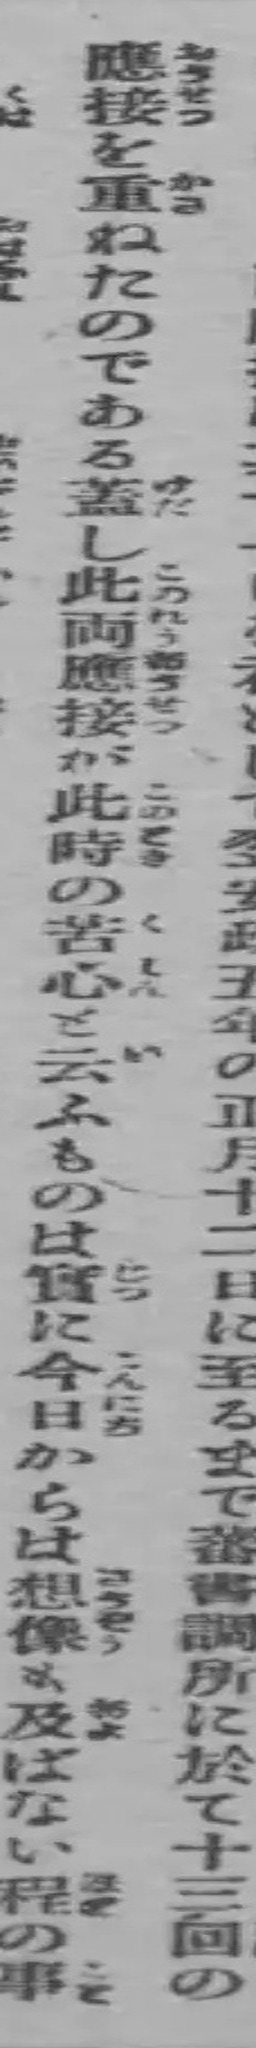応接を重ねたのである蓋し此両応接が此時の苦心と云ふものは実に今日からは想像も及ばない程の事
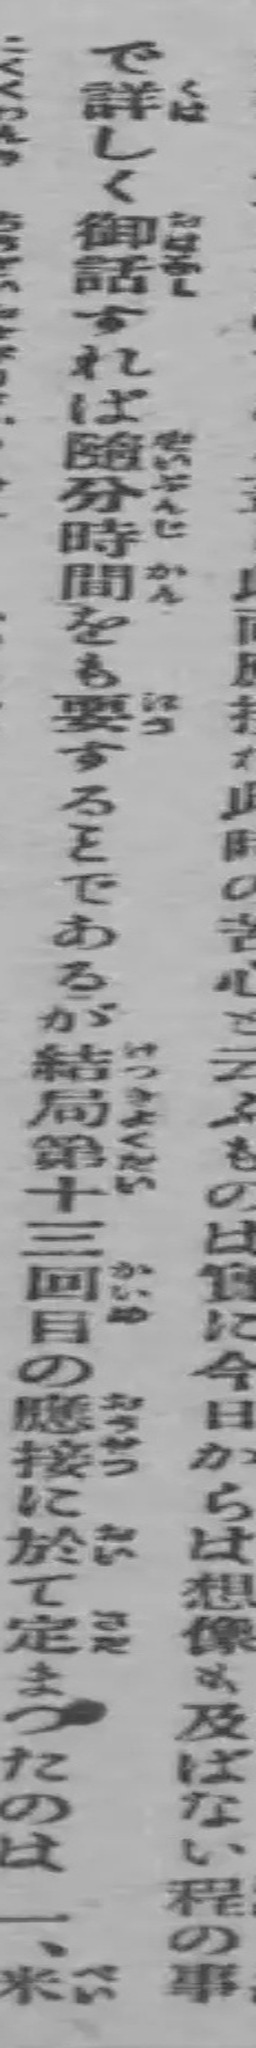で詳しく御話すれば随分時間をも要することであるが結局第十三回目の応接に於て定まつたのは一、米
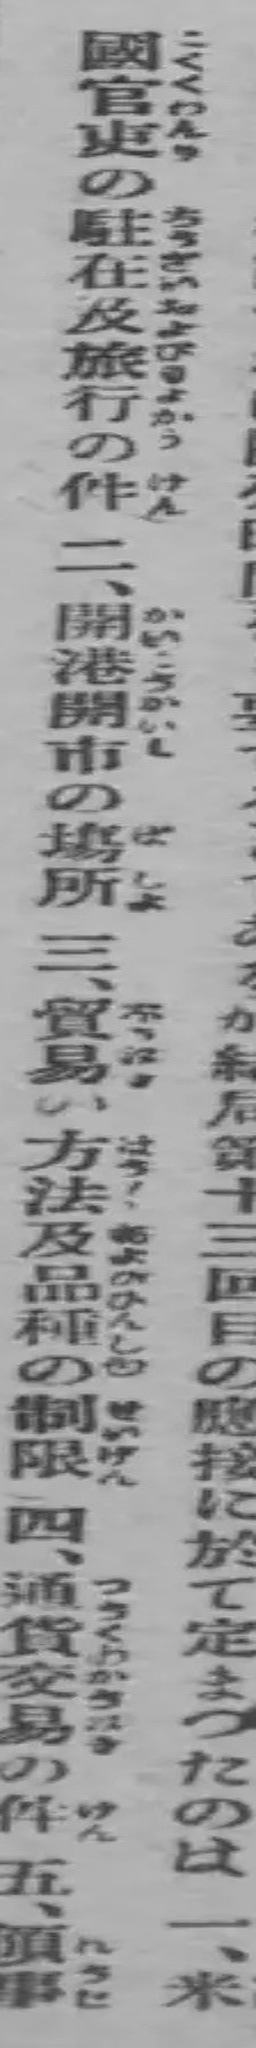国官吏の駐在及旅行の件二、開港開市の場所三、貿易の方法及品種の制限四、通貨交易の件五、領事
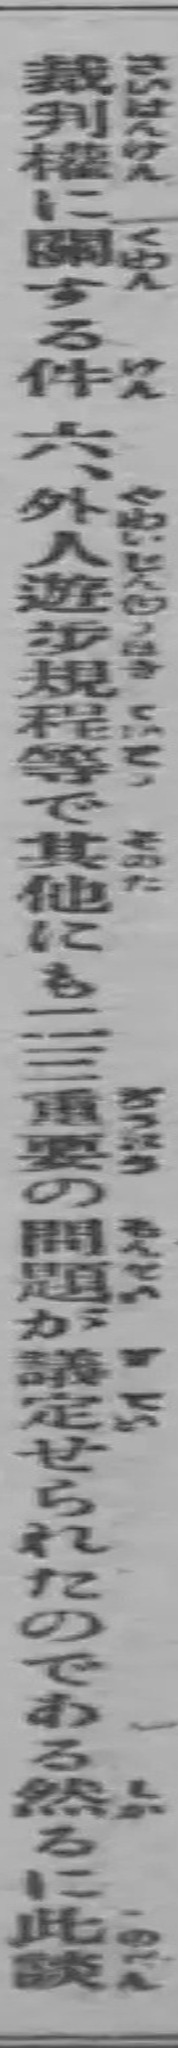裁判権に関する件六、外人遊歩規程等で其他にも二三重要の問題が議定せられたのである然るに此談
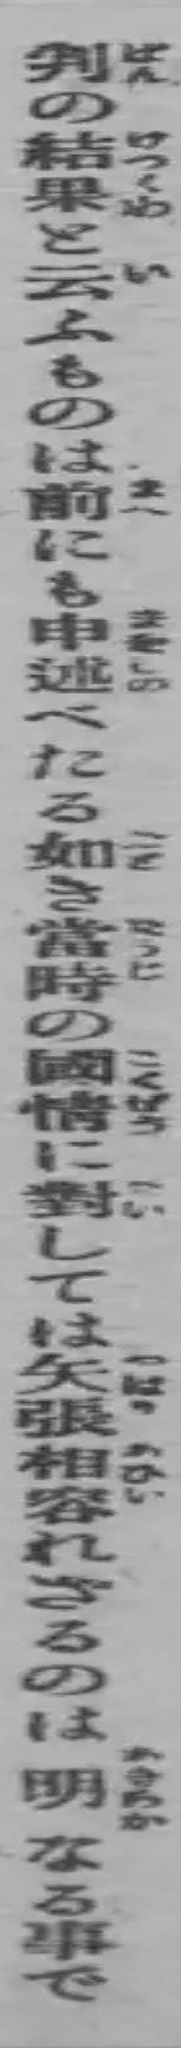判の結果と云ふものは前にも申述べたる如き当時の国情に対しては矢張相容れざるのは明なる事で
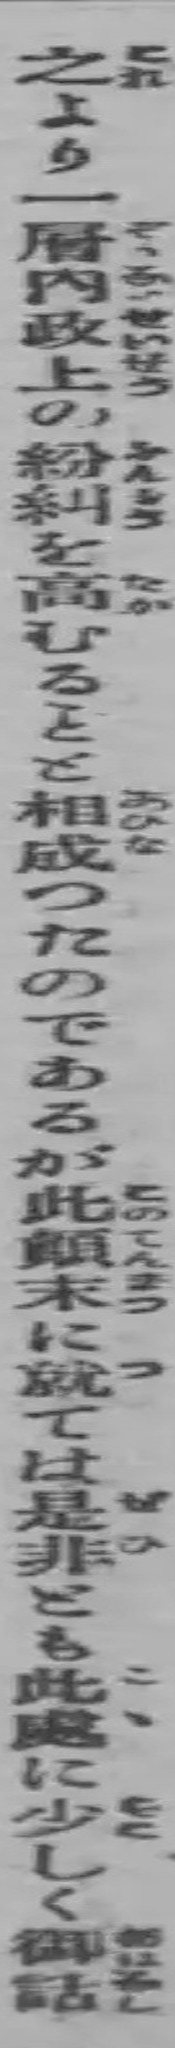之より一層内政上の紛糾を高むることと相成つたのであるが此顚末に就ては是非とも此処に少しく御話
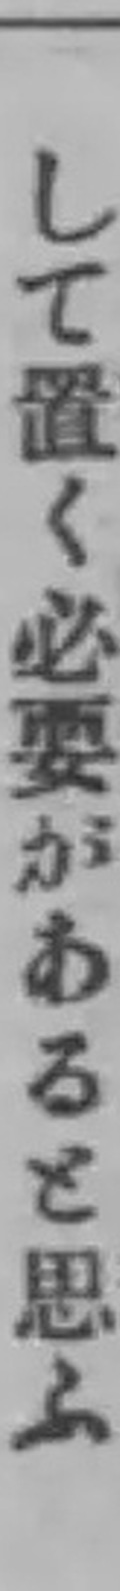して置く必要があると思ふ
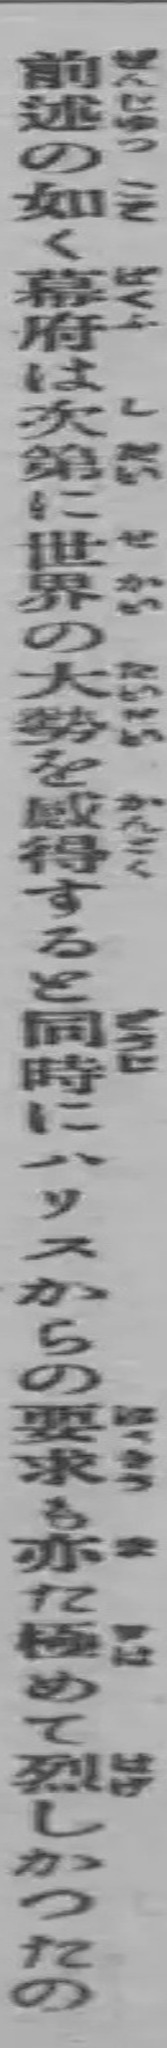前述の如く幕府は次第に世界の大勢を感得すると同時にハリスからの要求も亦た極めて烈しかつたの
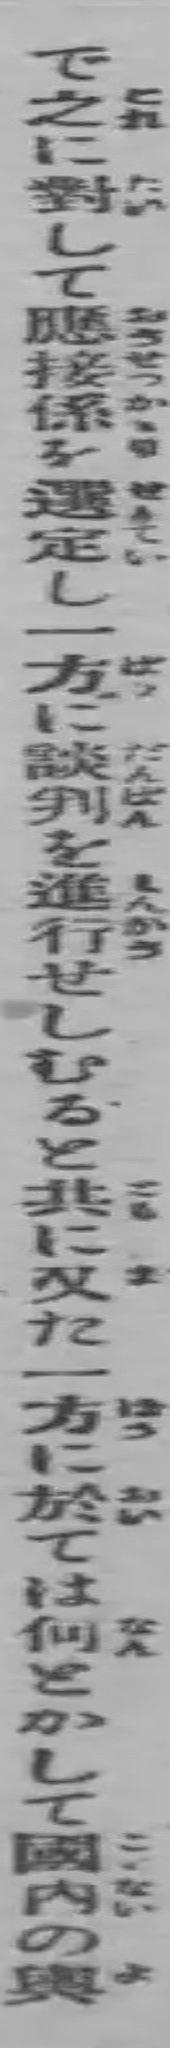で之に対して応接係を選定して一方に談判を進行せしむると共に又た一方に於ては何とかして国内の輿
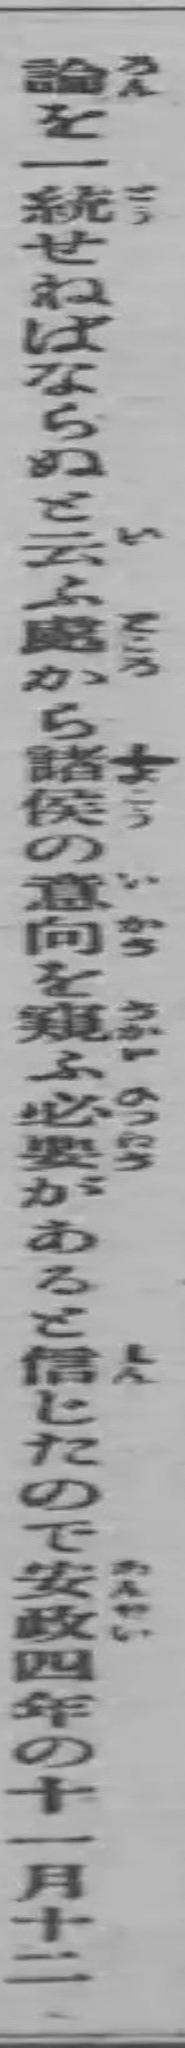諸侯の意見論を一統せねばならぬと云ふ処から諸侯の意向を窺ふ必要があると信じたので安政四年の十一月十二
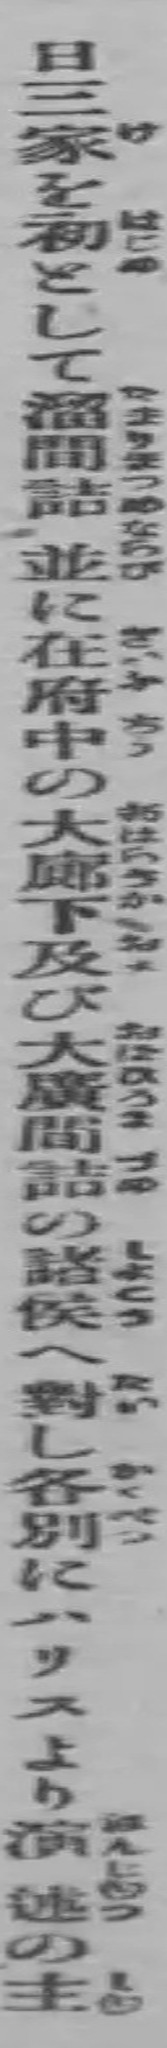日三家を初として溜間詰並に在府中の大廊下及び大広間詰の諸侯へ対し各別にハリスより演述の主
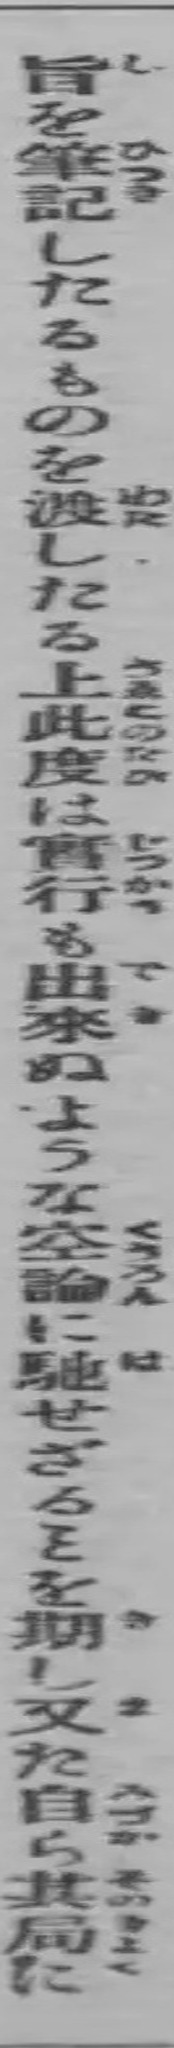旨を筆記したるものを渡したる上此度は実行も出来ぬような空論に馳せざることを期し又た自ら其局に
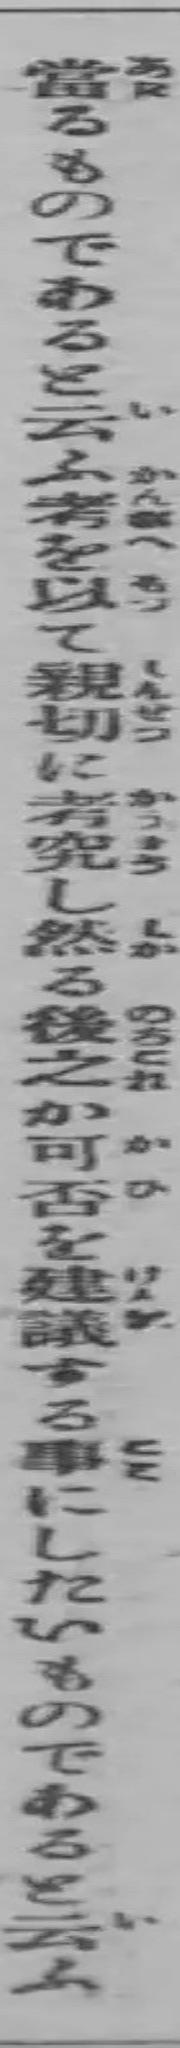当るものであると云ふ考を以て親切に考究し然る後之か可否を建議する事にしたいものであると云ふ
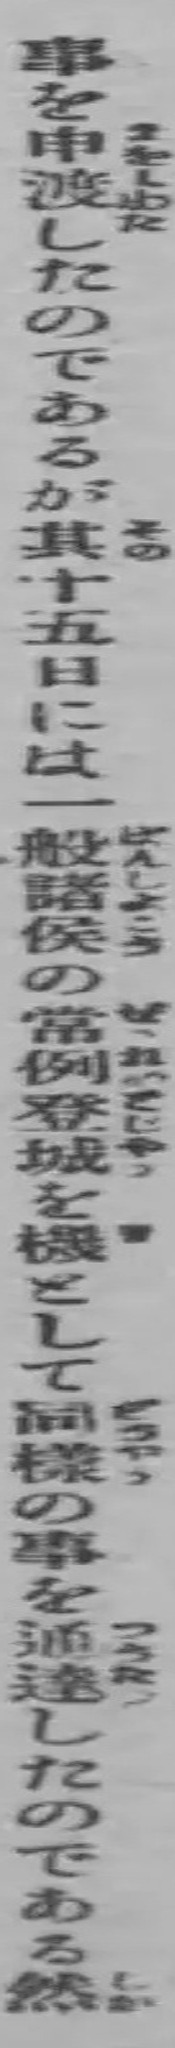事を申渡したのであるが其十五日には一般諸侯の常例登城を機として同様の事を通達したのである然
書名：豊橋市史談
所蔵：国立国会図書館 National Diet Library, JAPAN
